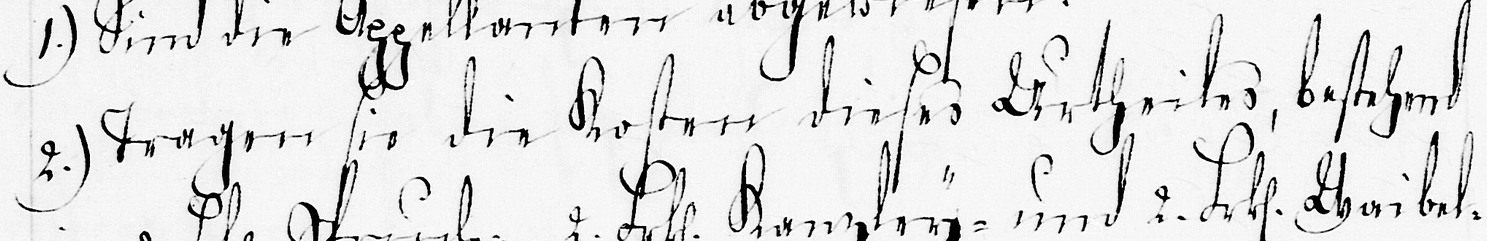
2.) Tragen sie die Kosten dieses Urtheiles, bestehend
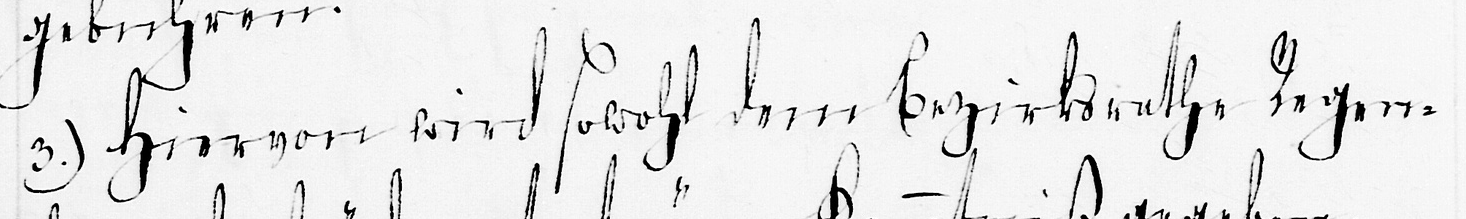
3.) Hiervon wird sowohl dem Bezirksrathe Regen¬
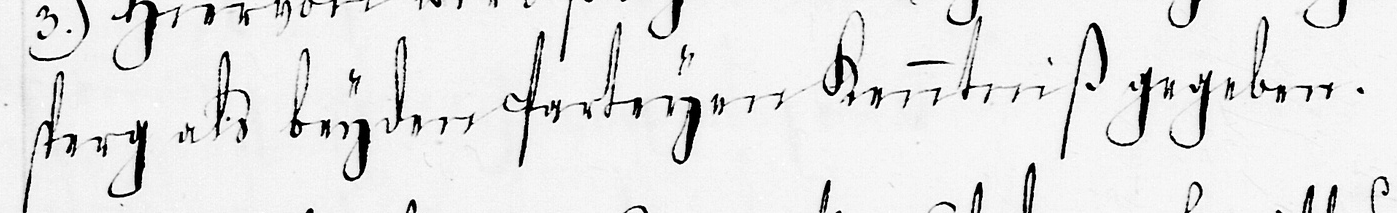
sperg als beyden Parteyen Kenntniß gegeben.
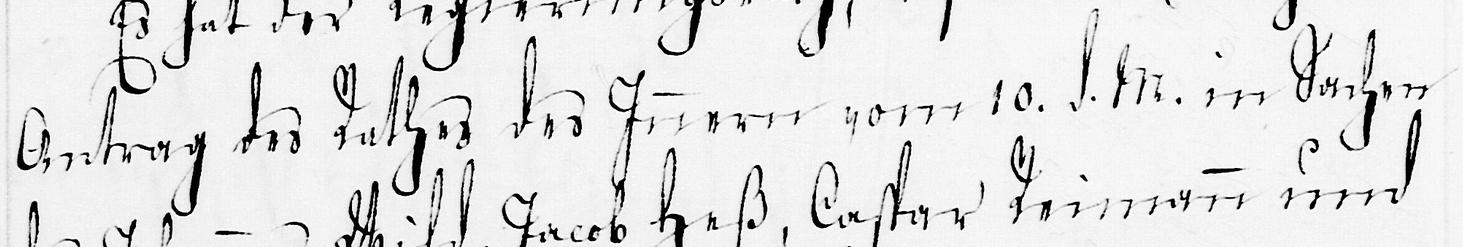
Antrag des Rathes des Innern vom 10. d. M. in Sachen
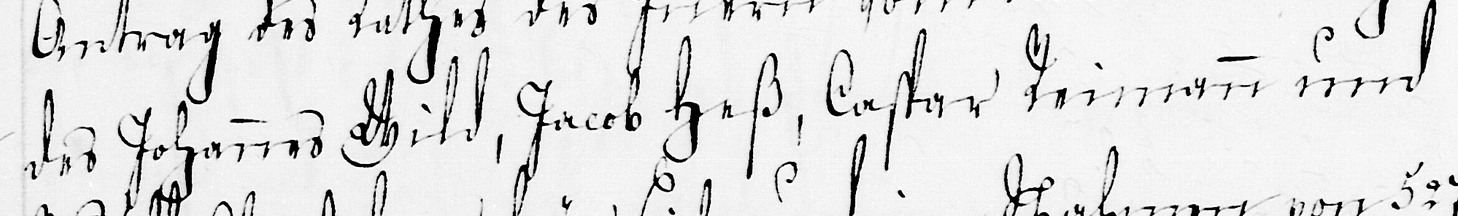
des Johannes Wild, Jacob Heß, Caspar Reimann und
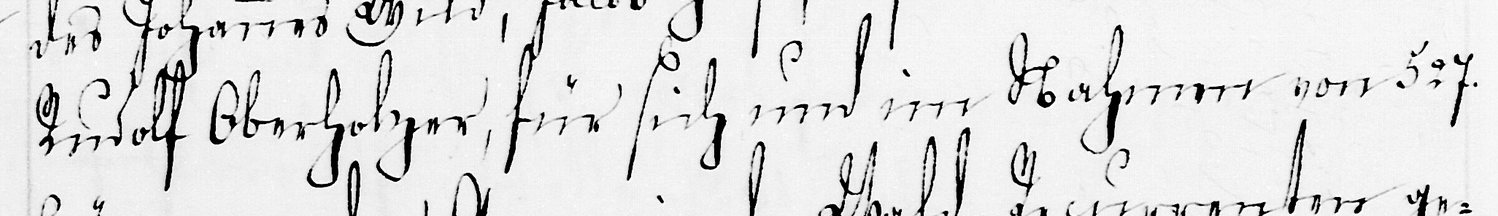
Rudolf Oberholzer, für sich und im Nahmen von 527.
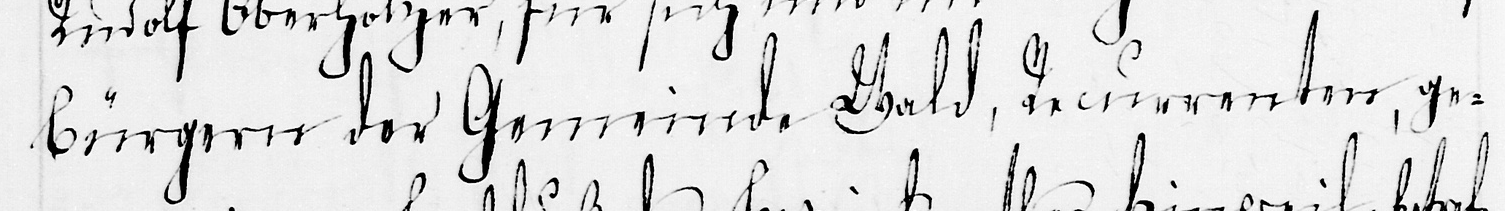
Bürgern der Gemeinde Wald, Recurrenten, ge¬
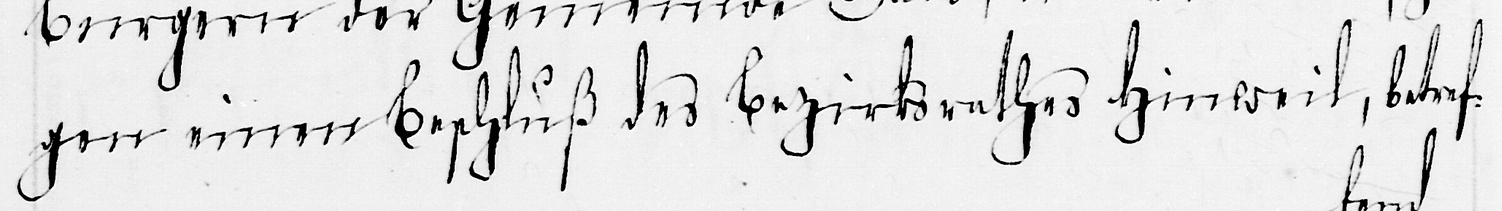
gen einen Beschluß des Bezirksrathes Hinweil, betref-
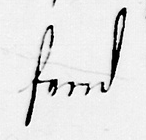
und
